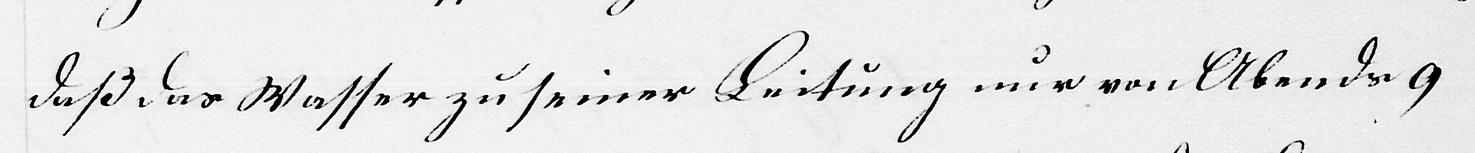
daß das Wasser zu seiner Leitung nur von Abends 9
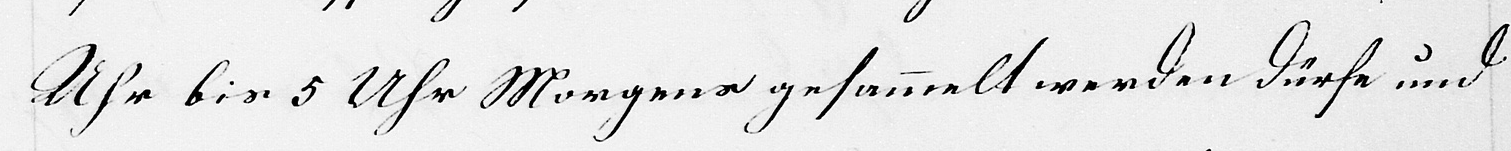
Uhr bis 5 Uhr Morgens gesammelt werden dürfe und
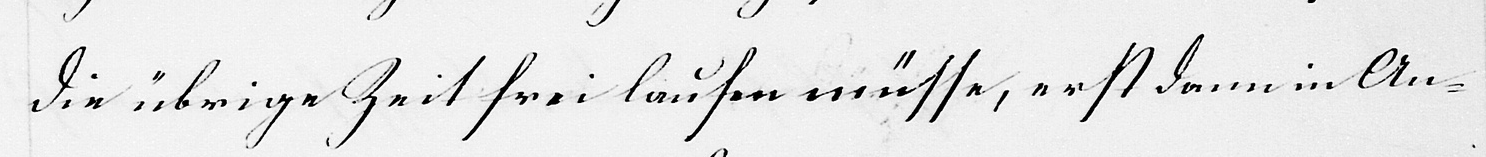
die übrige Zeit frei laufen müsse, erst dann in An¬
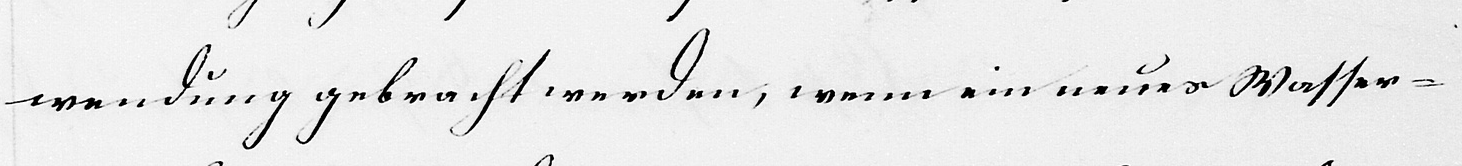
wendung gebracht werden, wenn ein neues Wasser¬
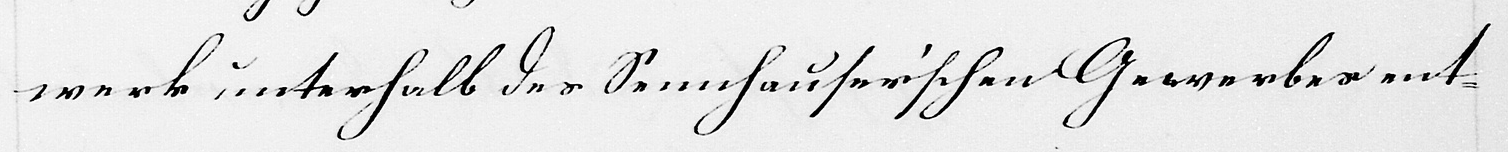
werk unterhalb des Sennhauserischen Gewerbes ent¬
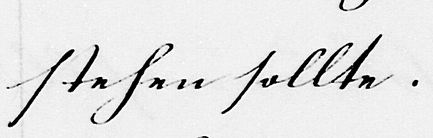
stehen sollte.
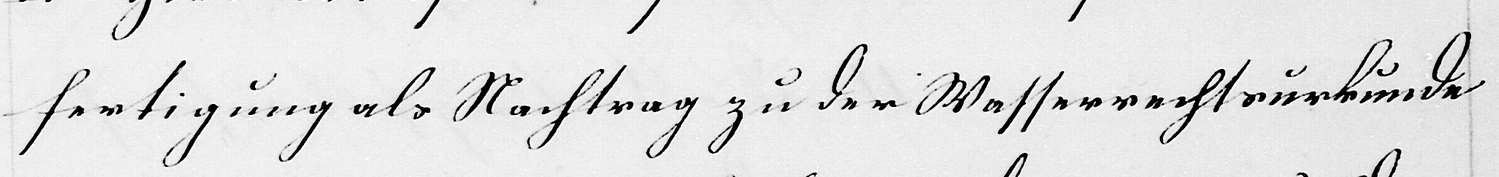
fertigung als Nachtrag zu der Wasserrechtsurkunde
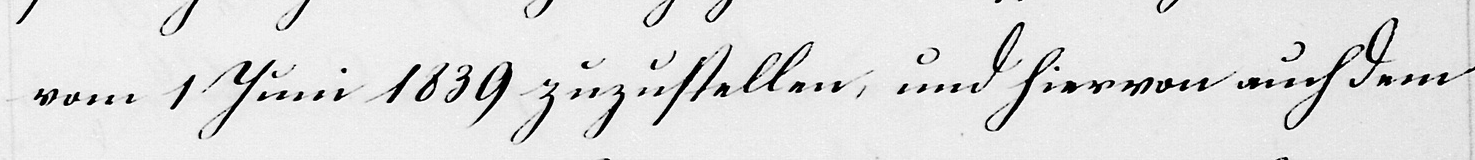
vom 1 Juni 1839 zuzustellen, und hiervon auch dem
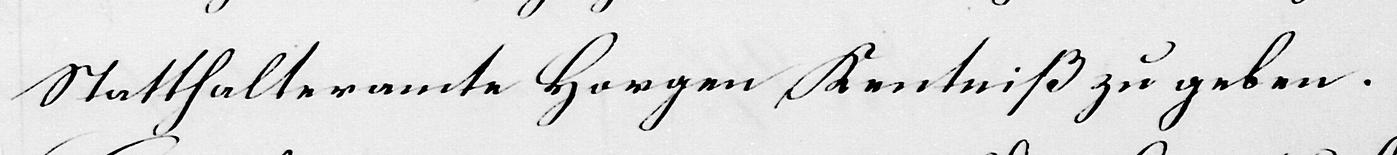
Statthalteramte Horgen Kentniß zu geben.
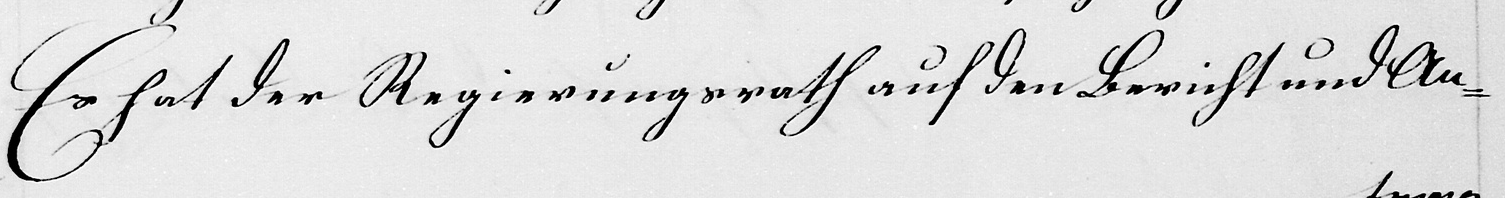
Es hat der Regierungsrath auf den Bericht und An-
